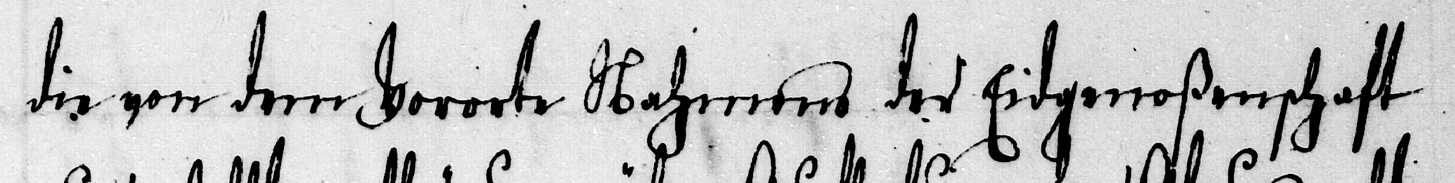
die von dem Vororte Nahmens der Eidgenoßenschaft
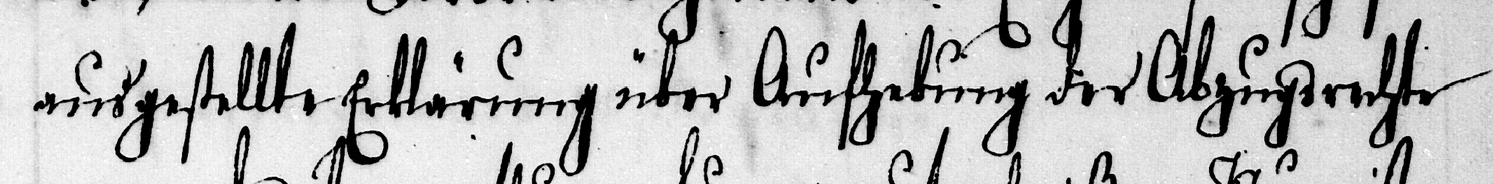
ausgestellte Erklärung über Aufhebung der Abzugsrechte
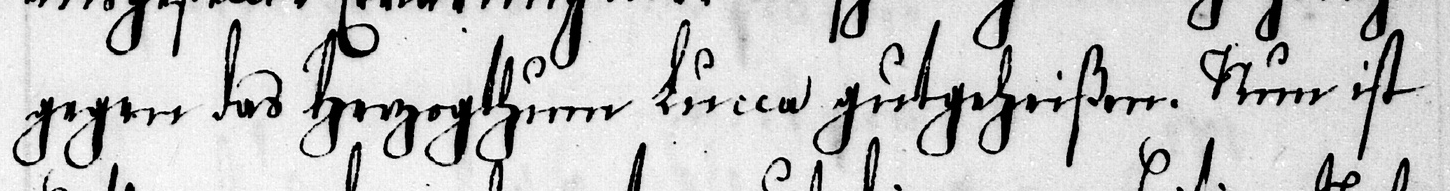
gegen das Herzogthum Lucca gutgeheißen. Nun ist
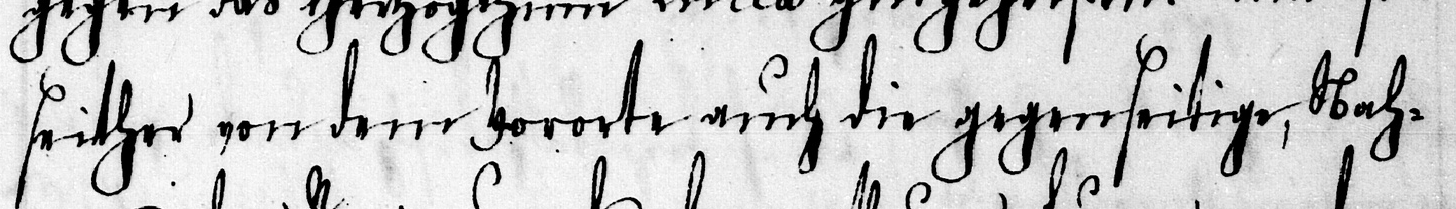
seither von dem Vororte auch die gegenseitige, Nah¬
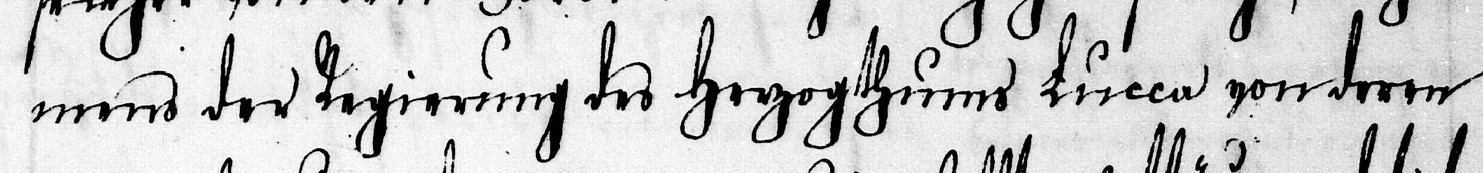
mens der Regierung des Herzogthums Lucca von deren
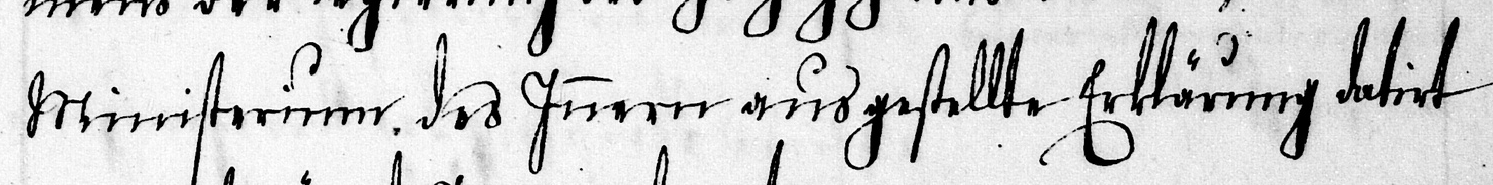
Ministerium des Innern ausgestellte Erklärung datirt
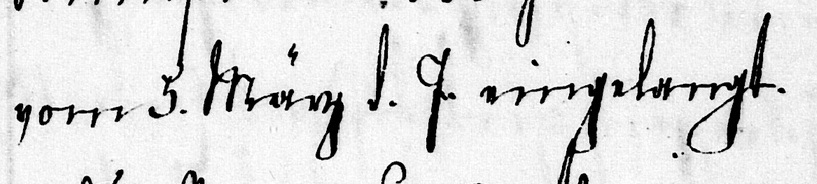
vom 5. März d. J. eingelangt.
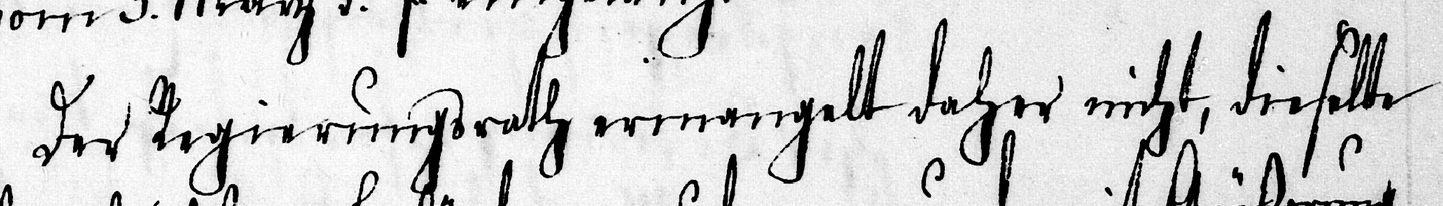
Der Regierungsrath ermangelt daher nicht, dieselbe
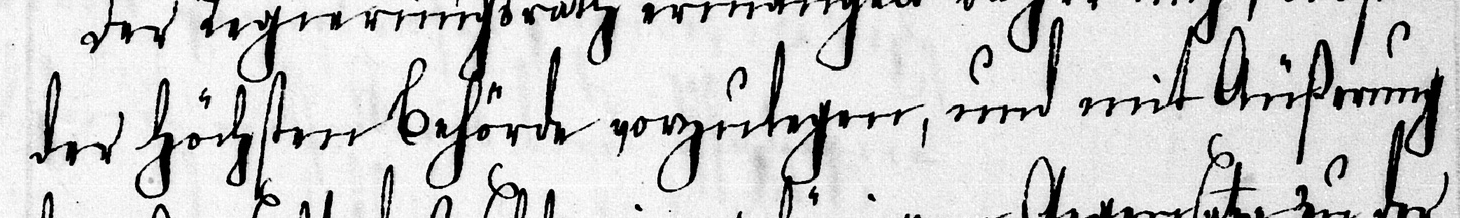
der Höchsten Behörde vorzulegen, und mit Äußerung
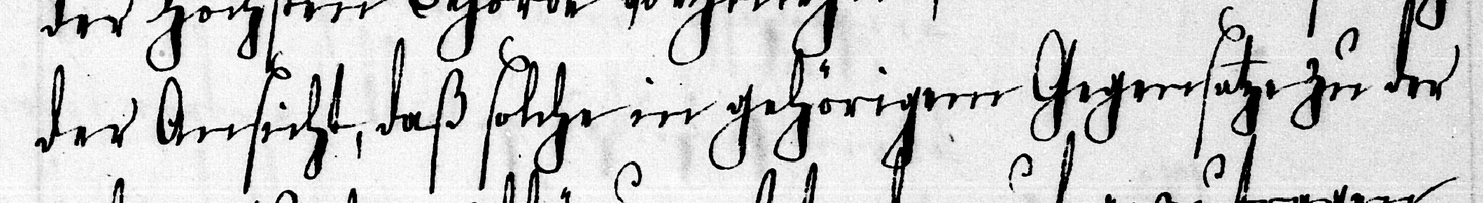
der Ansicht, daß solche in gehörigem Gegensatze zu der
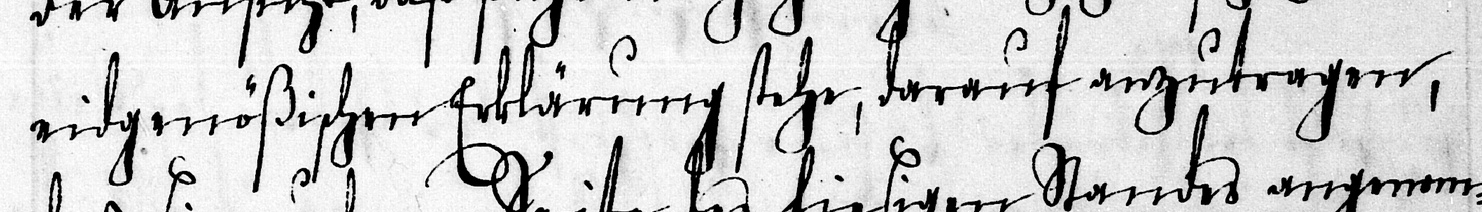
eidgenößischen Erklärung stehe, darauf anzutragen,
